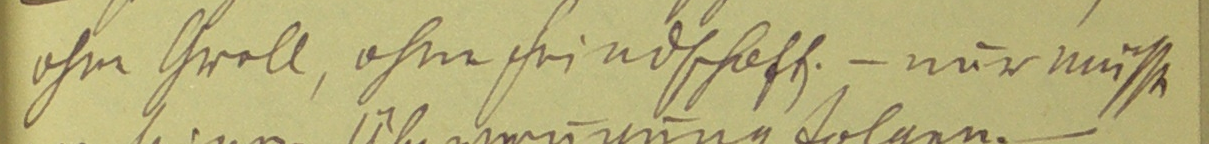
ohne Groll, ohne Feindschaft.-nur müsse
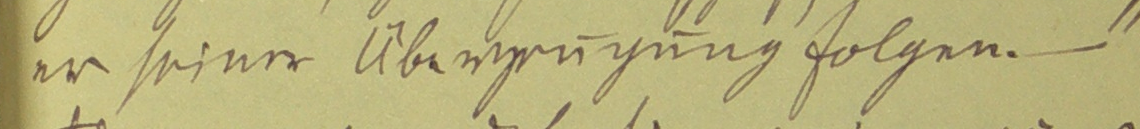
er seiner Überzeugung folgen.-
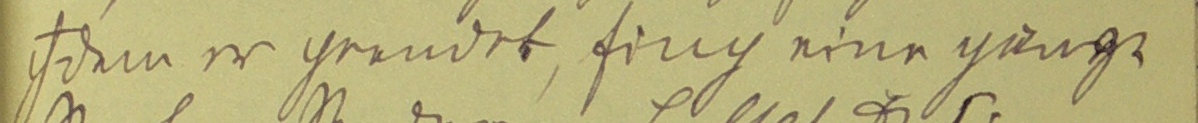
Nachdem er geendet, fing eine ganze
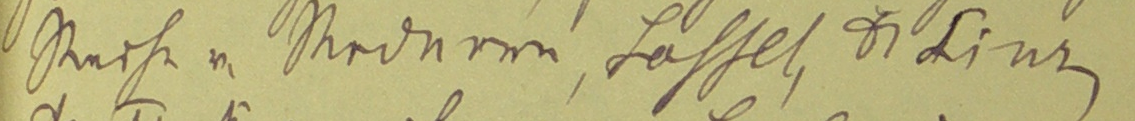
Reihe von Rednern, Lassel, Dr. Linz,
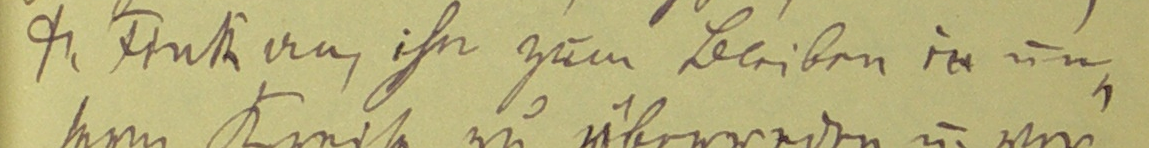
Dr. Fink an , ihn zum Bleiben in un¬
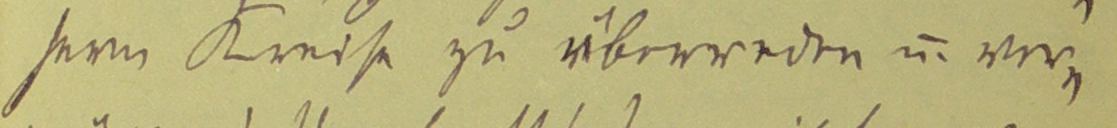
serem Kreis zu überreden und ?ver¬
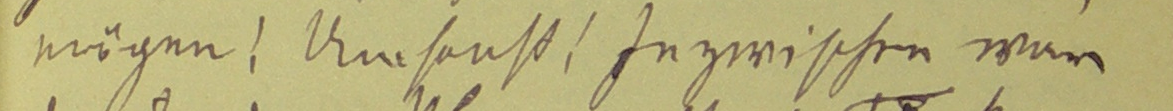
mögen..! Umsonst ! Inzwischen war
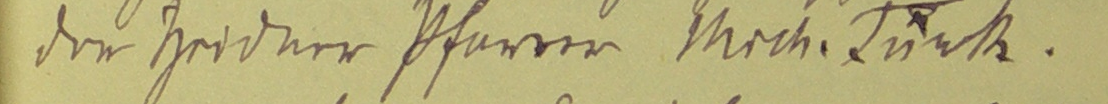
der Zeidner Pfarrer Mich. Türk
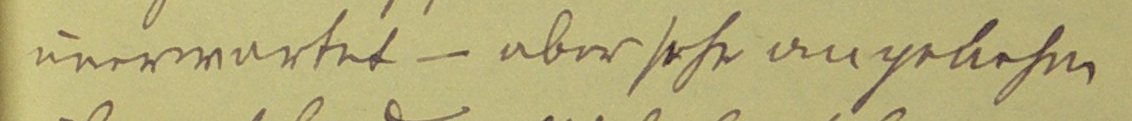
unerwartet –aber sehr angenehm
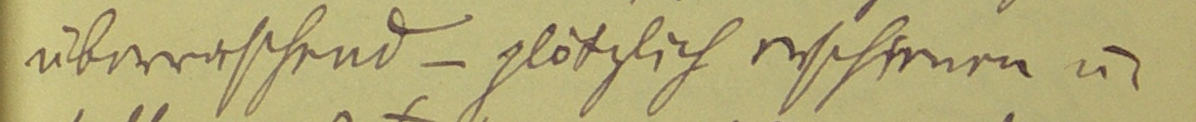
überraschend –plötzlich erschienen und
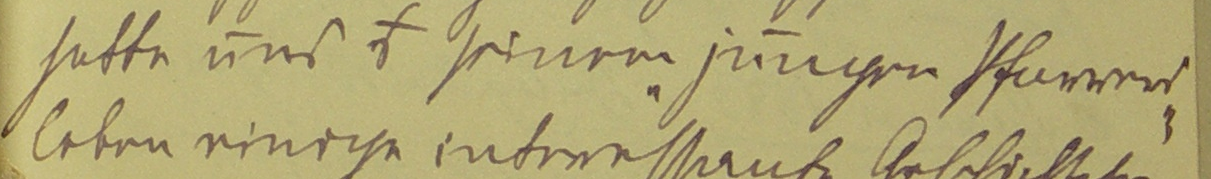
hatte uns aus seinen jungen Pfarrer¬
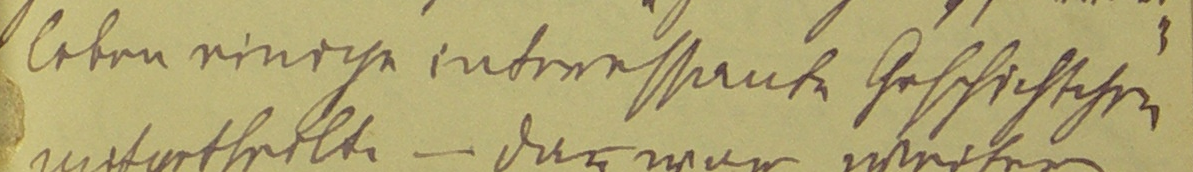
leben einige interessante Geschichten
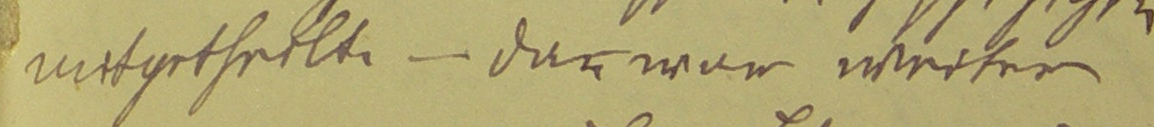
mitgebracht.- dann war weiter
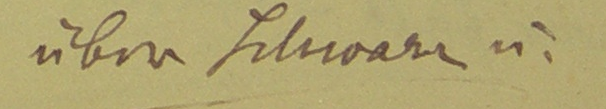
über Schwarz und
